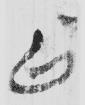㠯（以）
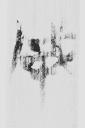成
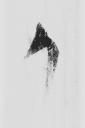人
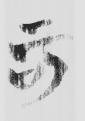可
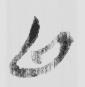㠯（以）
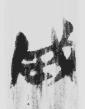成
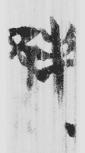邦
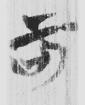可
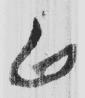㠯（以）
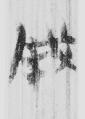成
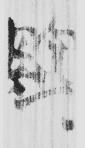地
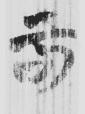可
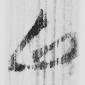㠯（以）
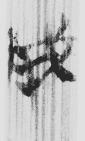成
